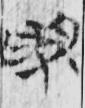受
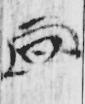○（期）
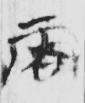丙
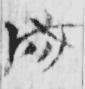戌
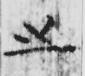之
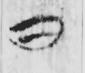日
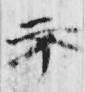不
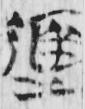𬨭（將）
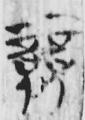競
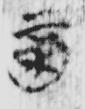梄
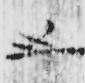之
